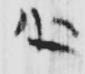少
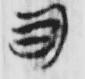司
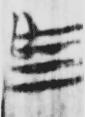馬
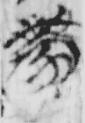𨍱（乘）
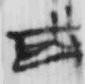或（又）
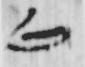㠯（以）
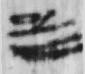足
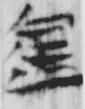金
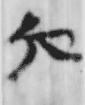六
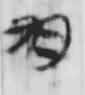匀（鈞）
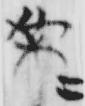枼枼
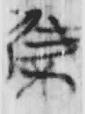集
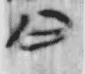公
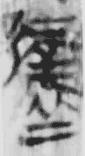逯
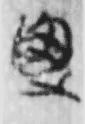受
